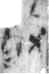敢
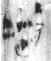告
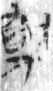桑
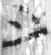之
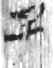子
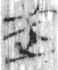武
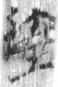○（夷）
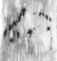尔
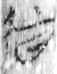居
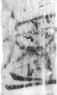○（復）
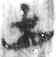山
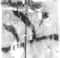之
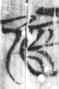○（址）
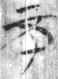不
